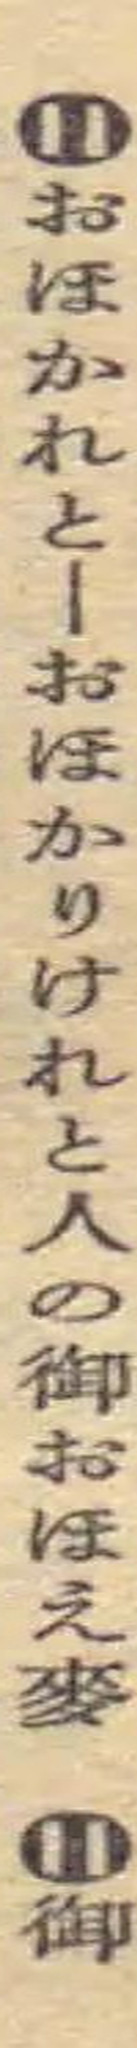⓫おほかれと―おほかりけれと人の御おほえ麦⓫御
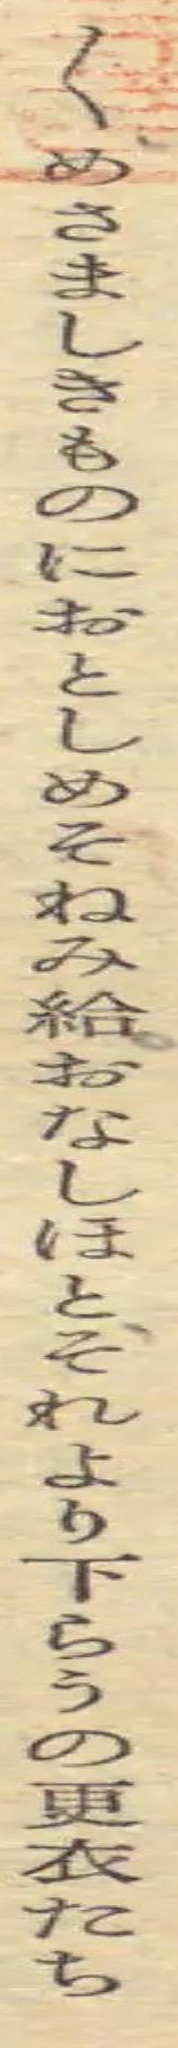〳〵めさましきものにおとしめそねみ給おなしほとそれより下らうの更衣たち
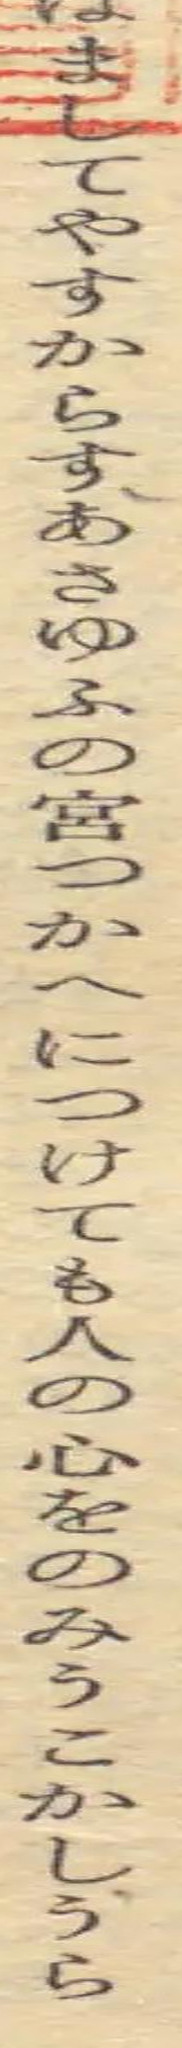はましてやすからすあきゆふの宮つかへにつけても人の心をのみうこかしうら
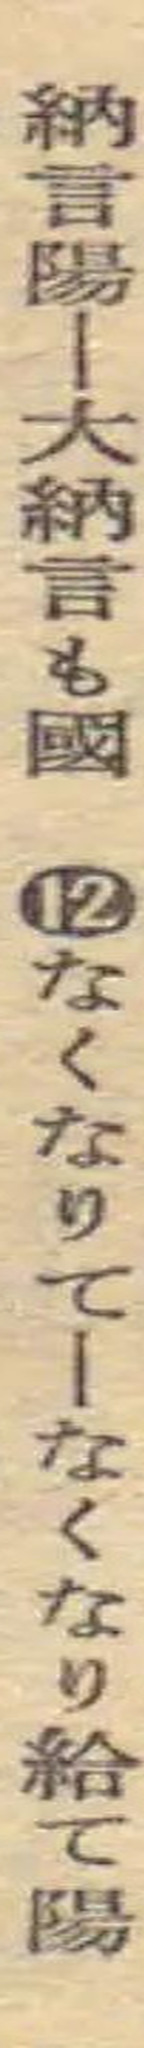納言陽―大納言も国⓬なくなりて―なくなり給て陽
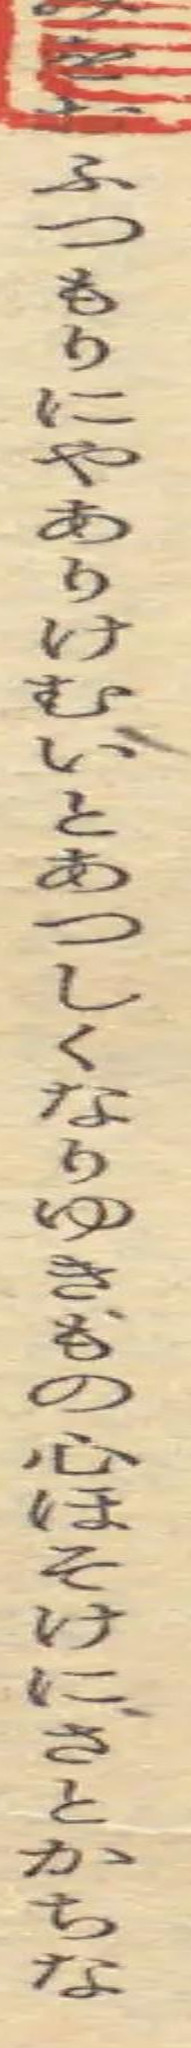みをおふつもりにやありけむいとあつしくなりゆきもの心ほそけにさとかちな
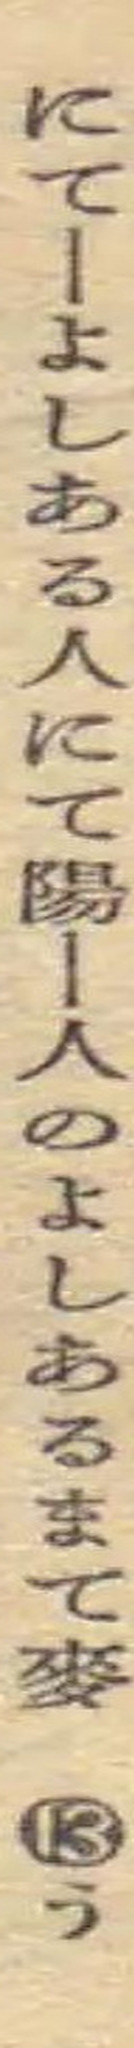にて―よしある人にて陽―人のよしあるまて麦⓭う
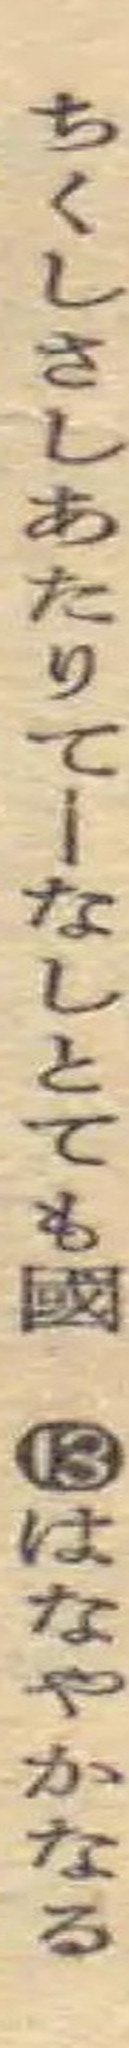ちくしさしあたりて―なしとても国⓭はなやかなる
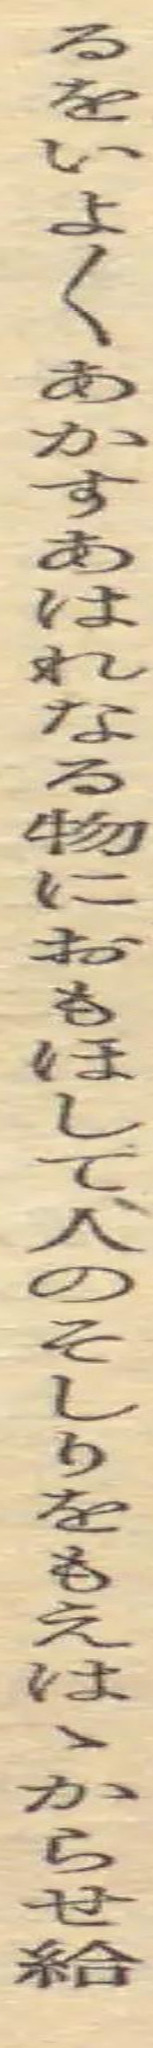るをいよ〳〵あかすあはれなる物におもほして人のそしりをもえはゝからせ給
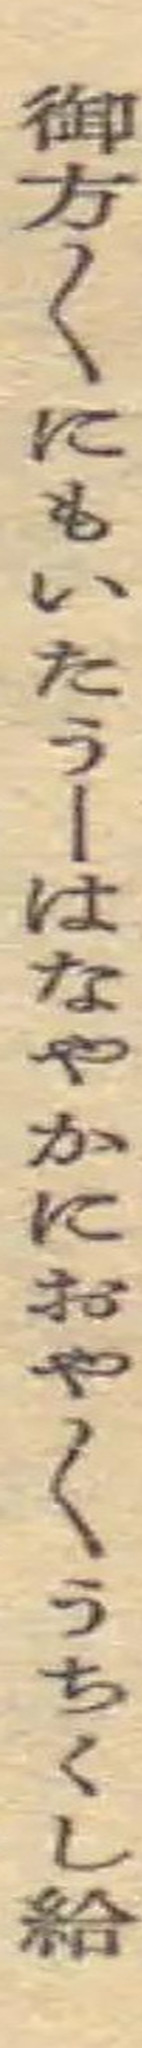御方〳〵にもいたう―はなやかにおや〳〵うちくし給
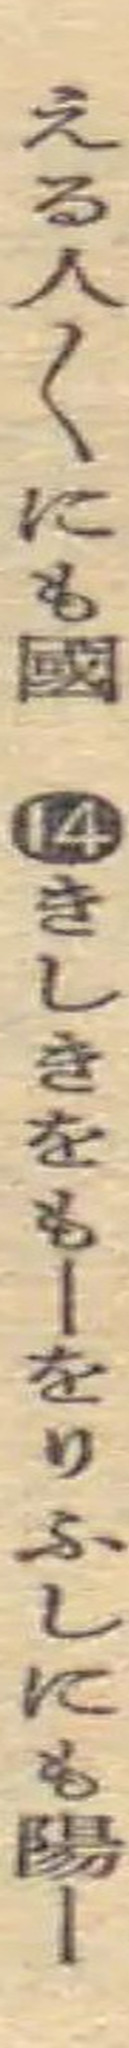える人〳〵にも国⓮きしきをも―をりふしにも陽―
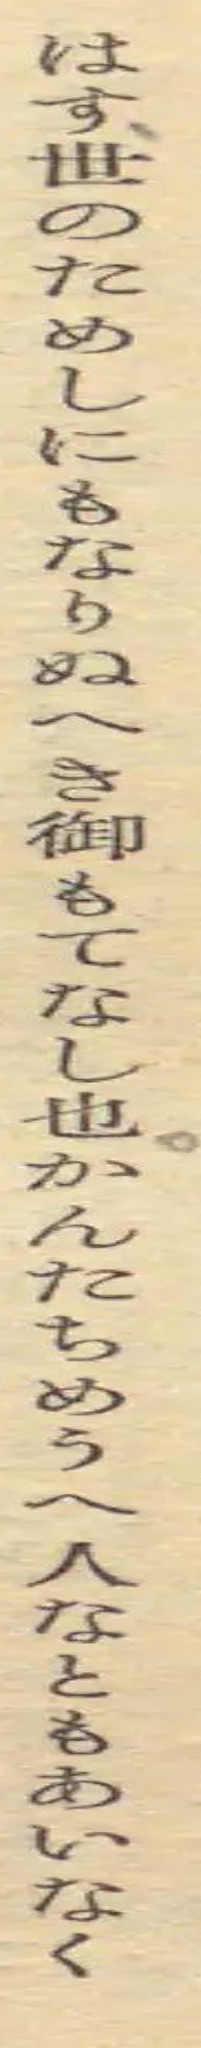はす世のためしにもなりぬへき御もてなし也かんたちめうへ人なともあいなく
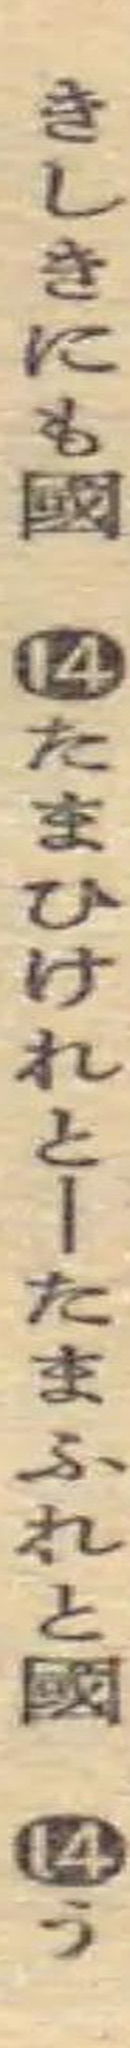きしきにも国⓮たまひけれと―たまふれと国⓮う
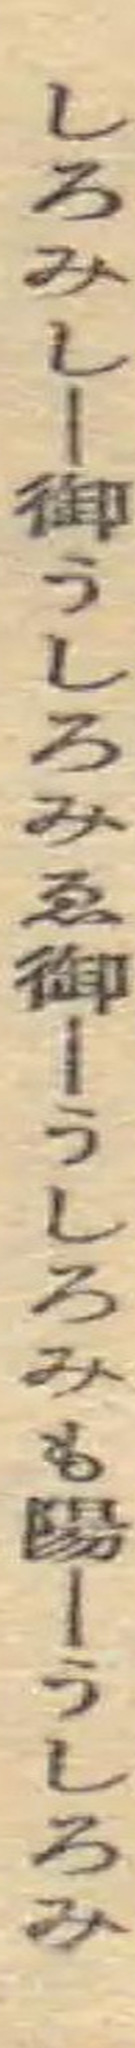しろみし―御うしろみゑ御―うしろみも陽―うしろみ
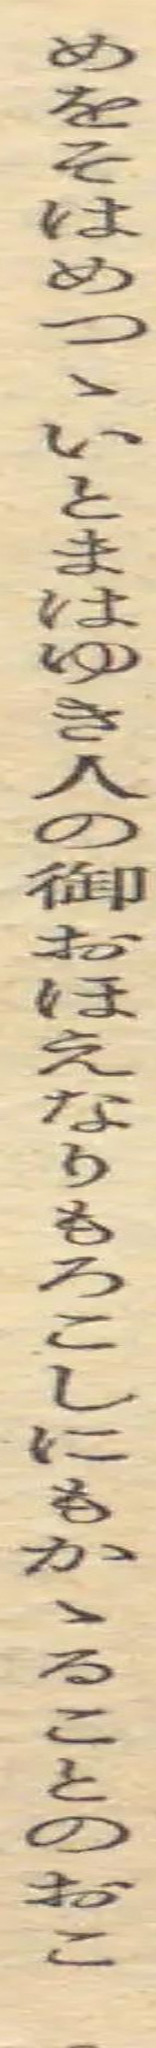めをそはめつゝいとまはゆき人の御おほえなりもろこしにもかゝることのおこ
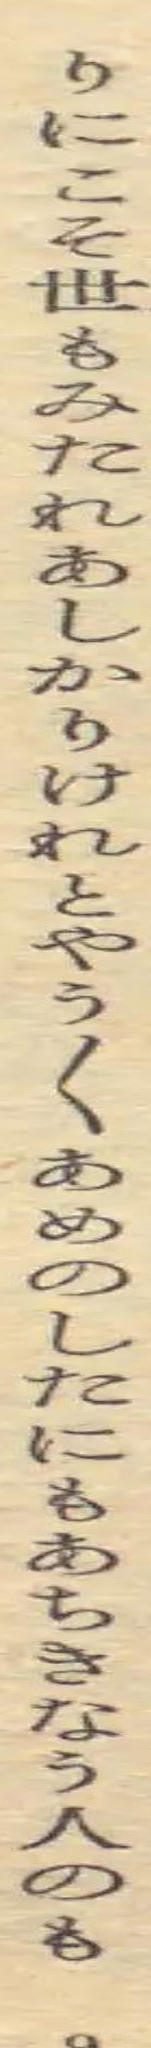りにこそ世もみたれあしかりけれとやう〳〵あめのしたにもあちきなう人のも
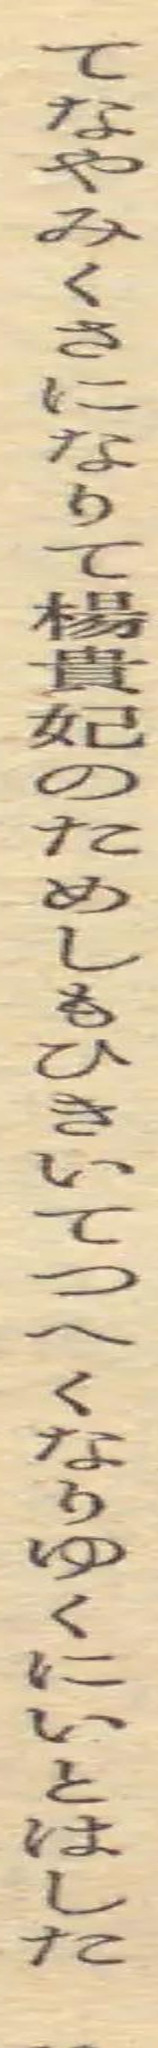てなやみくさになりて楊貴妃のためしもひきいてつへくなりゆくにいとはした
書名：校異源氏物語.
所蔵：国立国会図書館 National Diet Library, JAPAN
